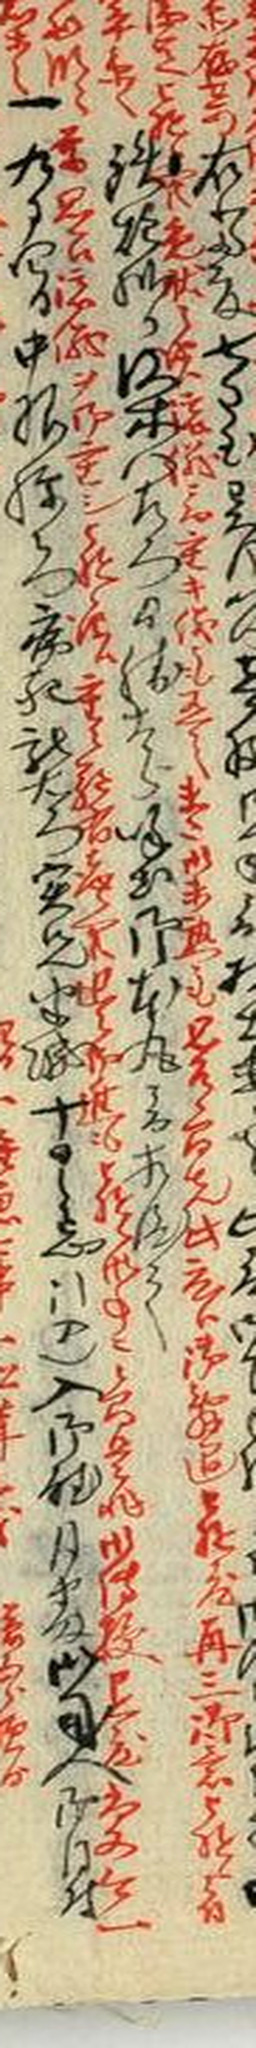一九月四日中根孫右衛門病死新右衛門実兄半減十日之忌引込入御聴月番御用人御目付
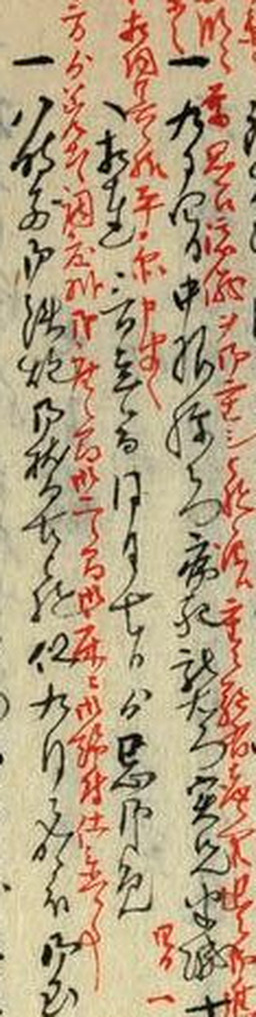へ相達三日立ニ而同月七日ゟ忌御免
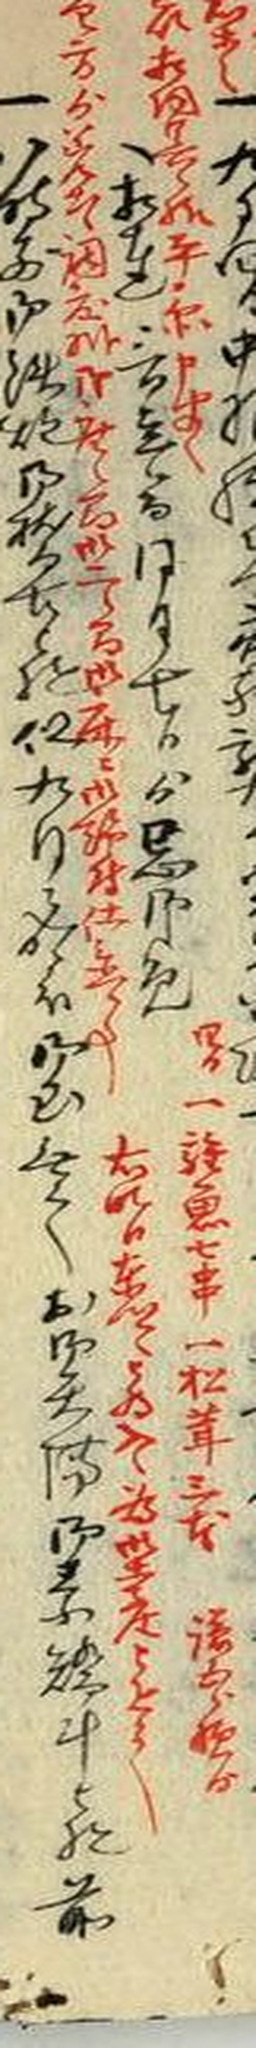一八時前御鉄炮御稽古被遊但九月ニ成候ニ付御玉無之於御矢場御素矯斗被遊前
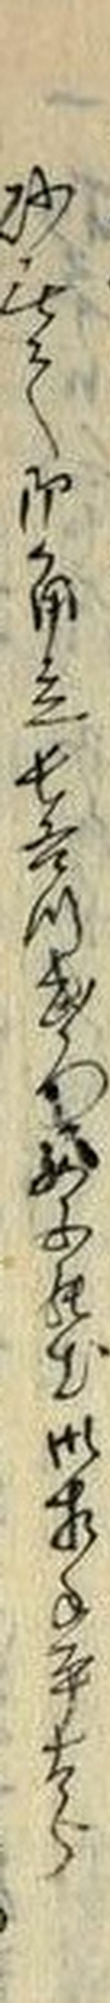砂無之御角立長谷川武右衛門父子罷出御相手平太郎
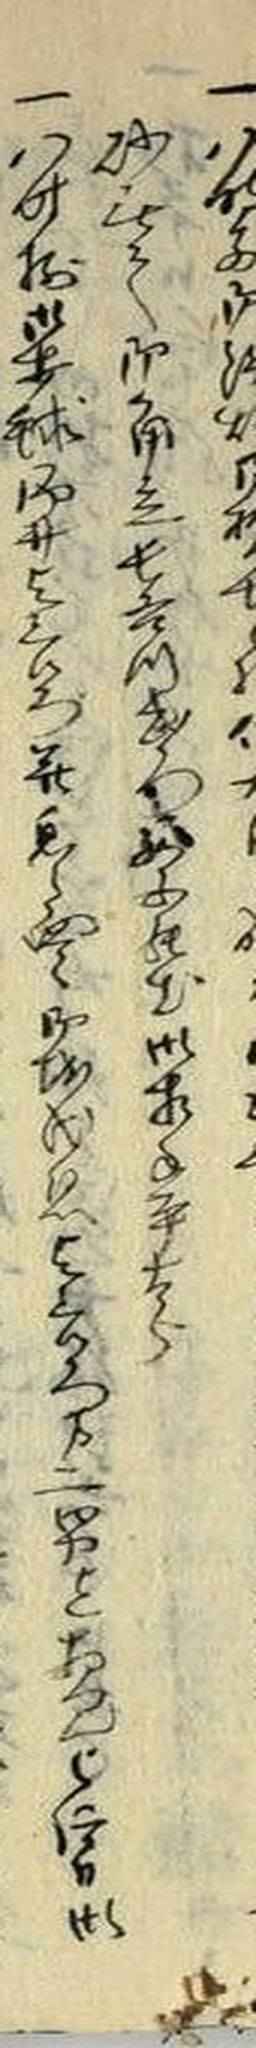一八時揃御打毬酒井与三左衛門幷息之面々御城代息与三左衛門方二男迄拝見被仰付御
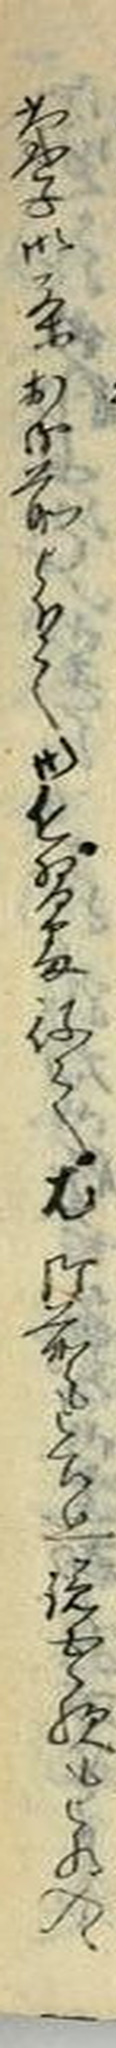菓子御茶於御前被下之御近習番役之尤御前ニも被召上謙五郎様も被為入候
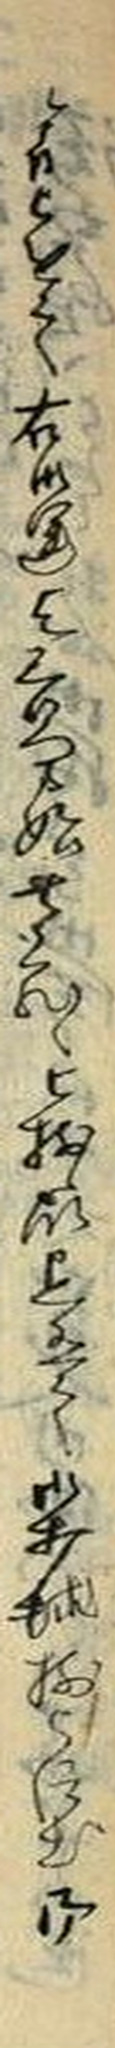ニ付被進之右御運与三左衛門方始芝御蔵へ被揃候段申上有之御打毬揃被仰出御
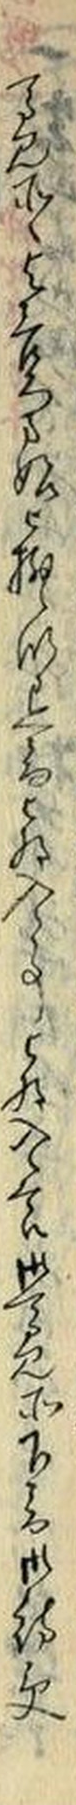馬見所へ与三左衛門方始被揃候段申上ニ而被為入候事被為入候節御馬見所下ニ而御待受
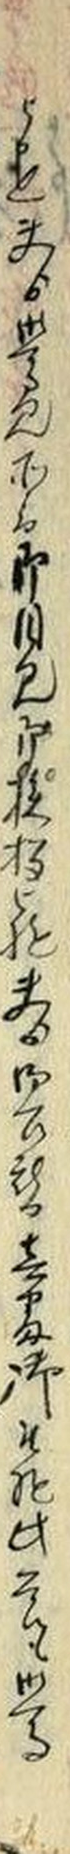被申上夫ゟ御馬見所ニ而御目見御挨拶被遊夫ゟ御召替壱番御被遊此節も御馬
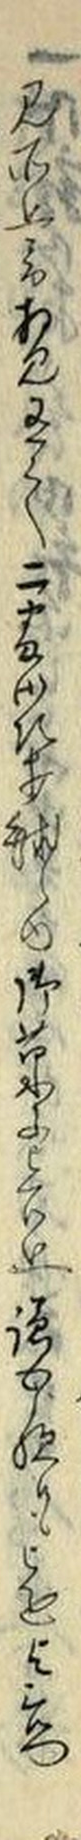見所上ニ而拝見有之二番御次打毬之内御菓子被召上謙五郎様江も被進与三左衛門
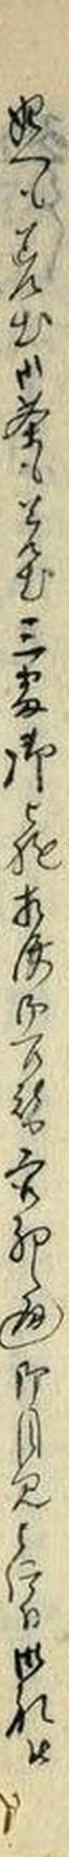始へも差出御茶も差出三番御被遊相済御召替最初之通御目見被仰付御礼被
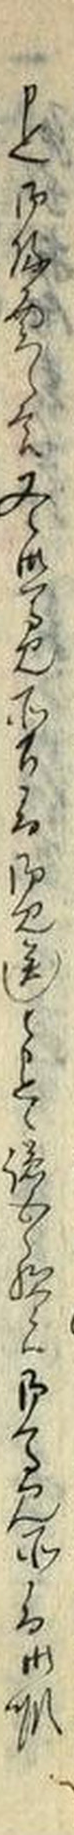申上御帰殿之節又々御馬見所下ニ而御見送被申上謙五郎様ニハ御馬見所ニ而御暇
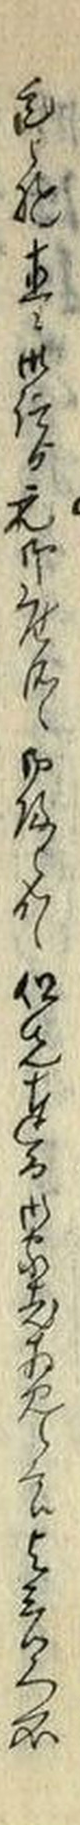乞被遊直ニ御跡ゟ元御座所へ御帰被成候但先達而御家老拝見之節与三左衛門不
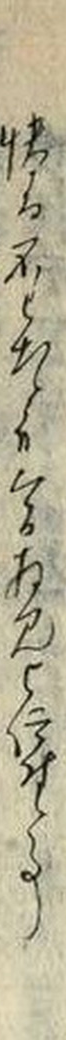快ニ而不被出候ニ付今日拝見被仰付候事
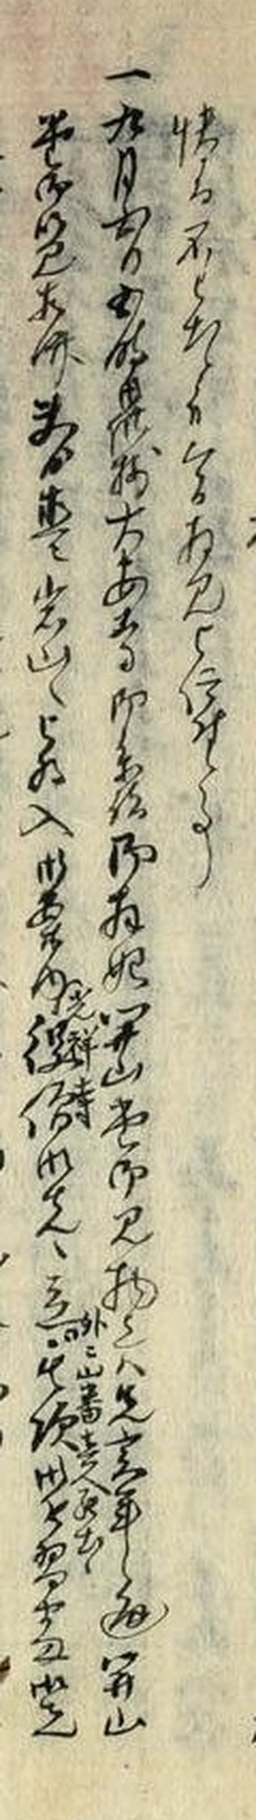一九月五日五時御供揃大安寺御参詣御拝始開山堂御見物迄ハ先亥年之通開山
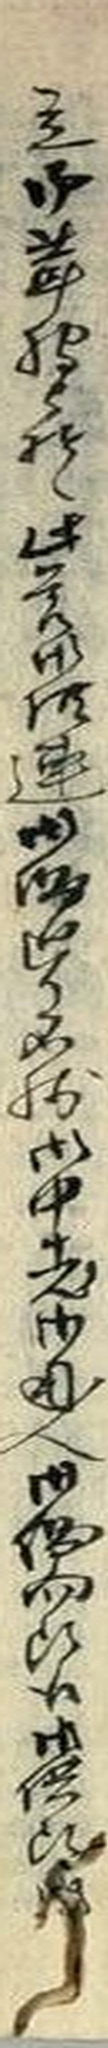立御茸狩被遊候此節御供連御側廻り不残御中老御用人御側向頭取御供頭御
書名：少傅日録抄（斉承付側向頭取日記、在国）
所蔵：福井県文書館 Fukui Prefectural Archives
